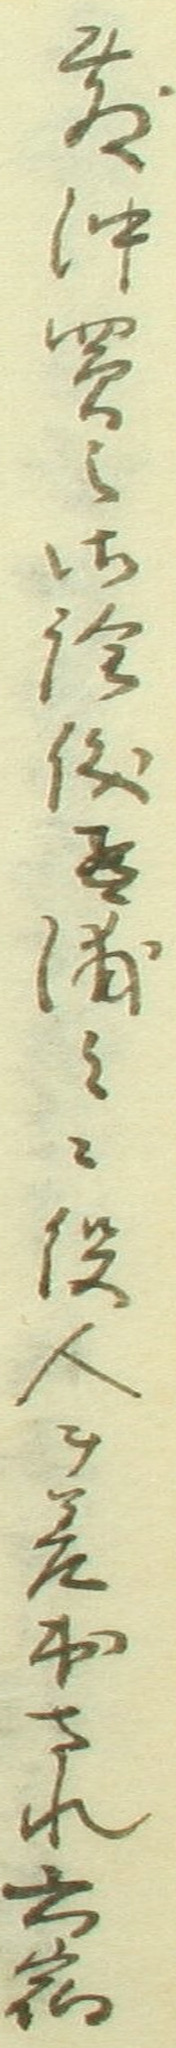敷沖買之御詮儀有浦之に役人を差出され六宿
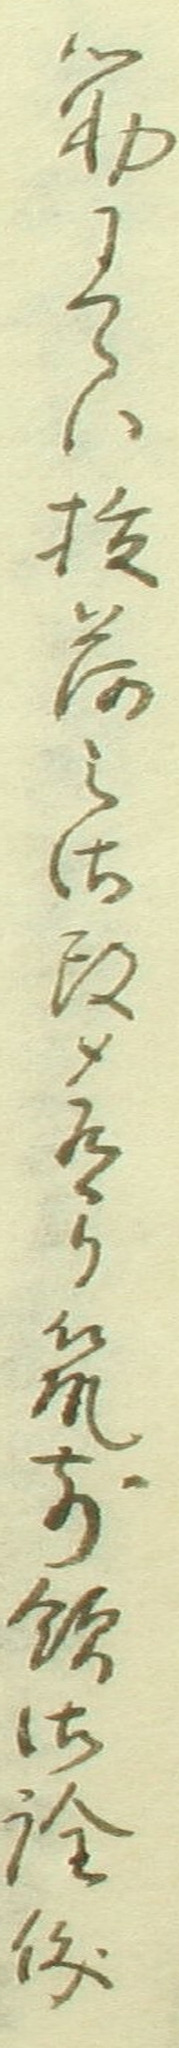筋にては抜荷之御改め有り筑前館御詮儀
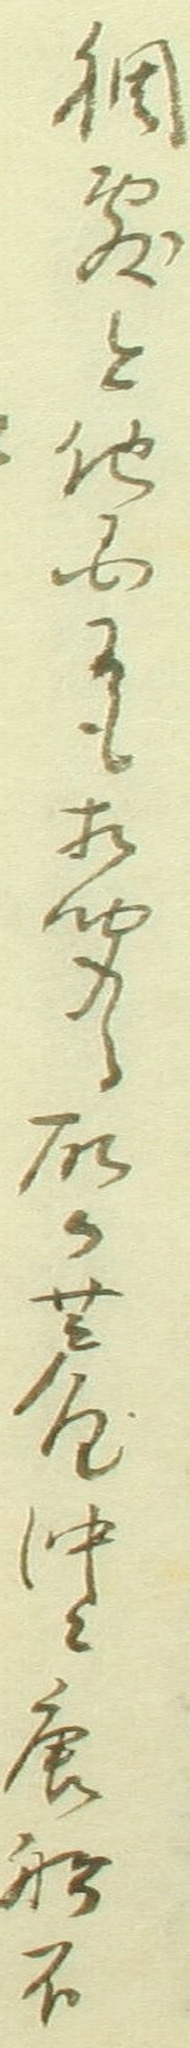稠敷と他国にも相聞る故か芦屋沖に唐船不
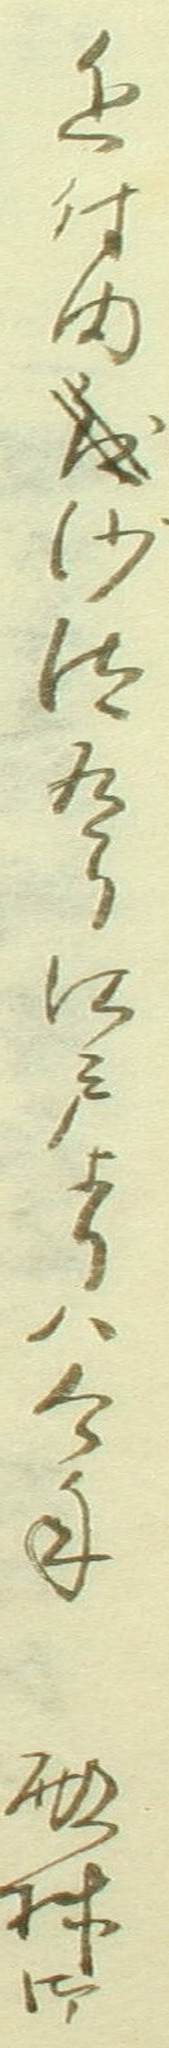近付内？取沙汰有り江戸よりは今年殿様御
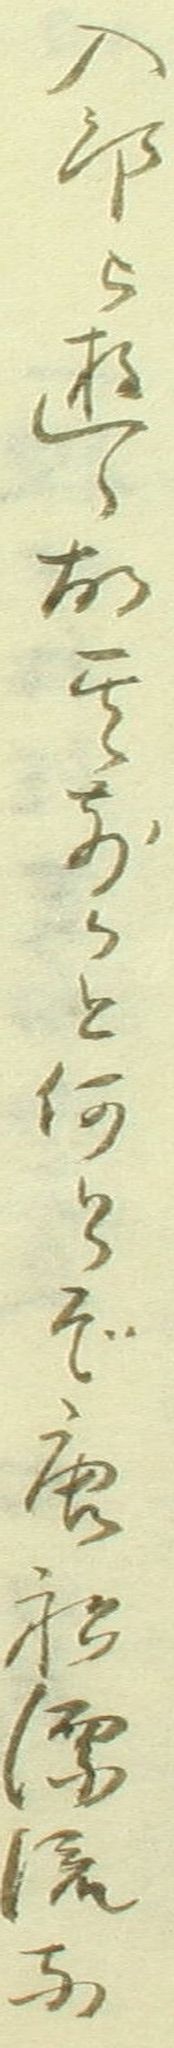入部被遊候故其前々と何とぞ唐船漂流な
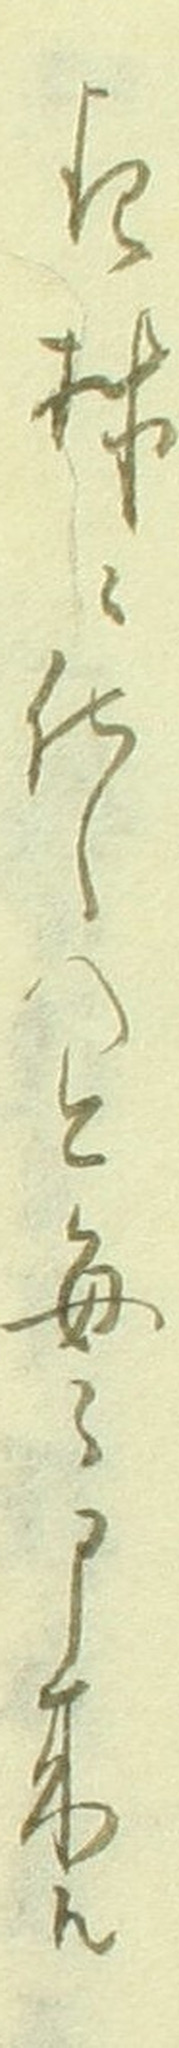き様に仕候へと毎々申来る
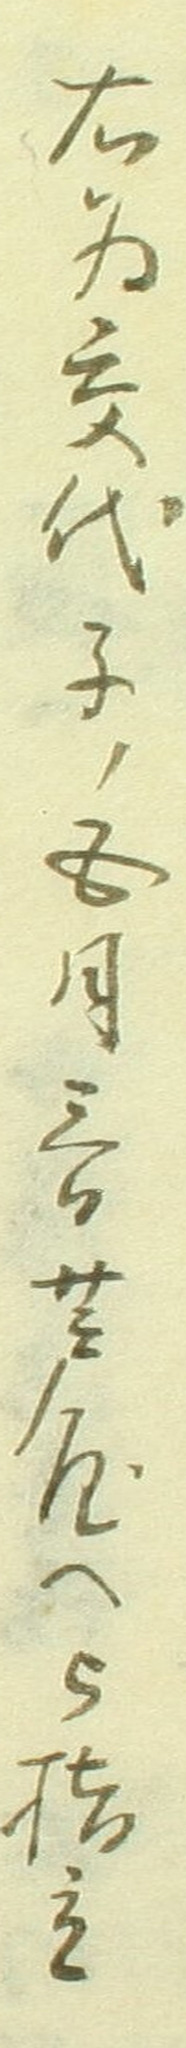右為交代子の五月三日芦屋へ被差立
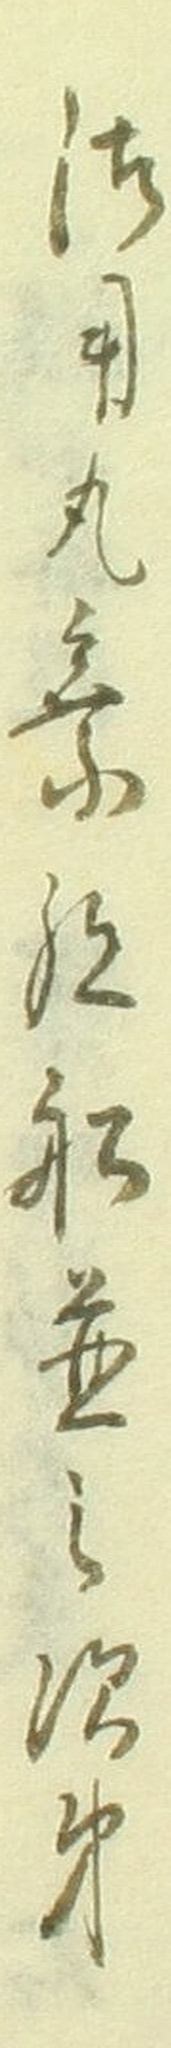御用丸乗組船並之次第
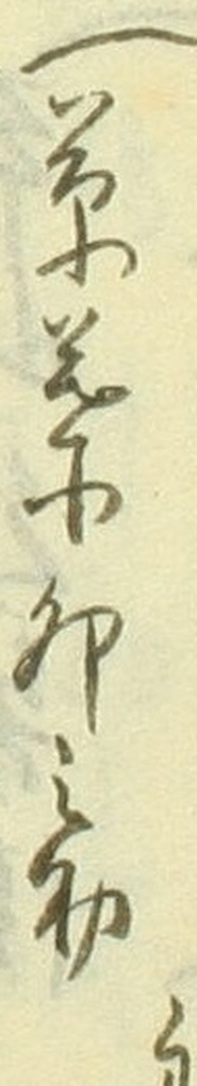草葉卯之助
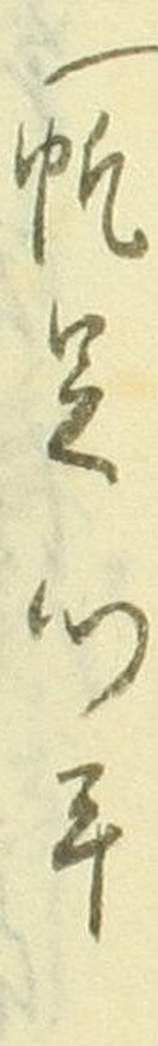帆足門平
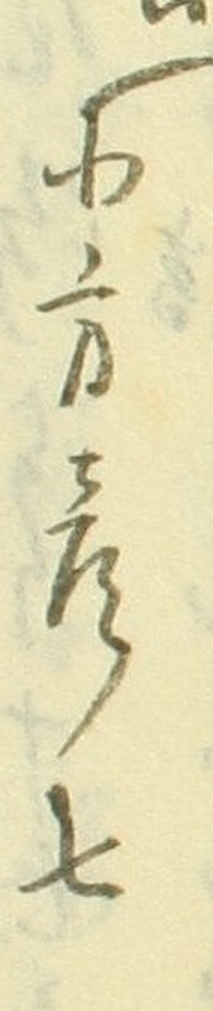小方彦七
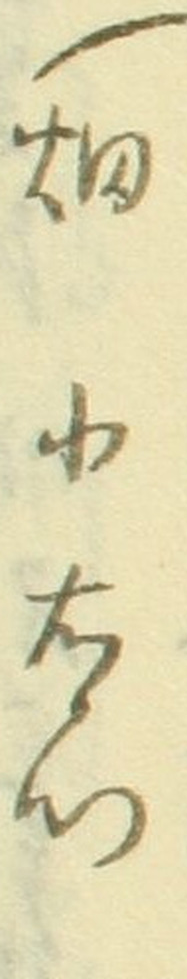畑小右衛門

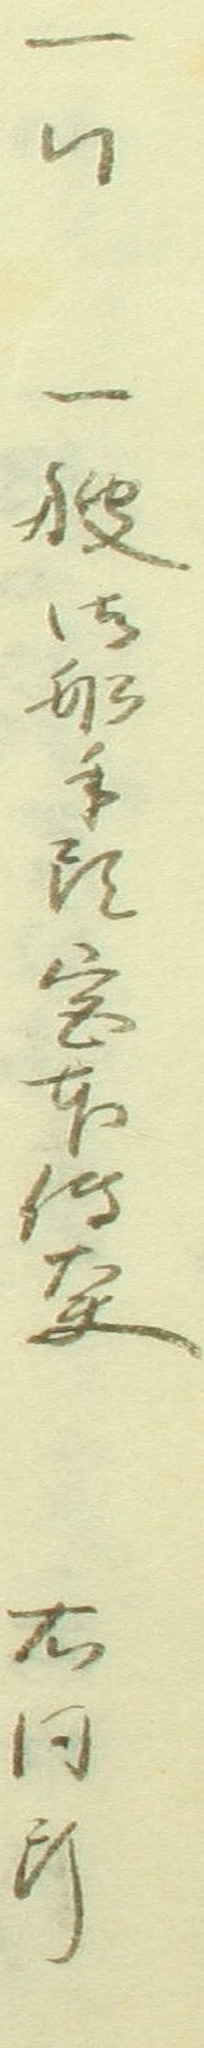一同一艘御船手頭宮本伝太夫右同断
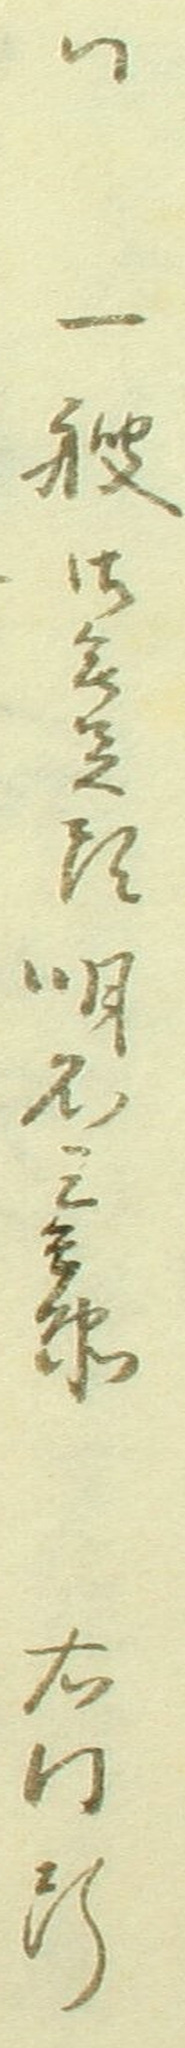一同一艘御無足頭明石三兵衛右同断
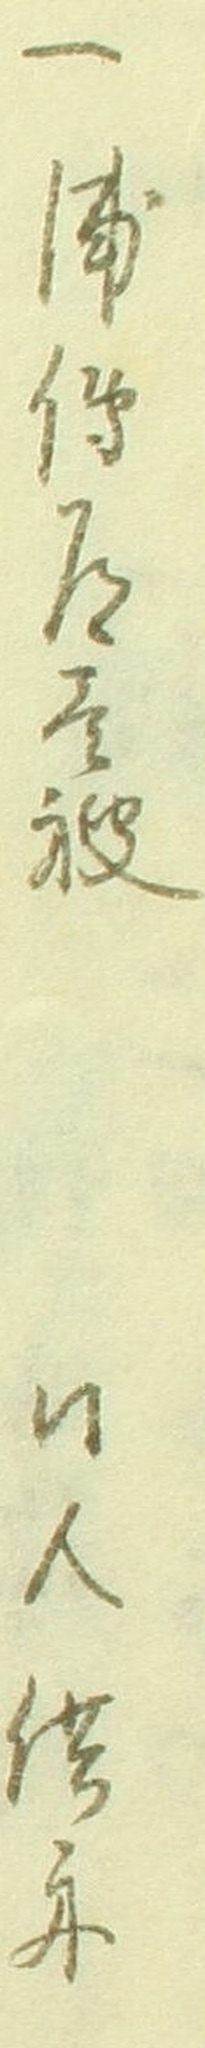一浦伝道壱艘同人借舟
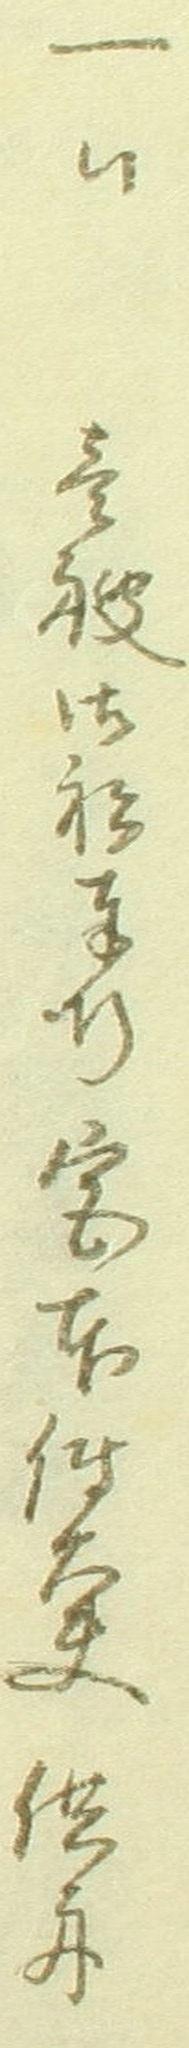一同壱艘御船奉行宮本伝太夫供舟
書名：唐船漂流記 四
